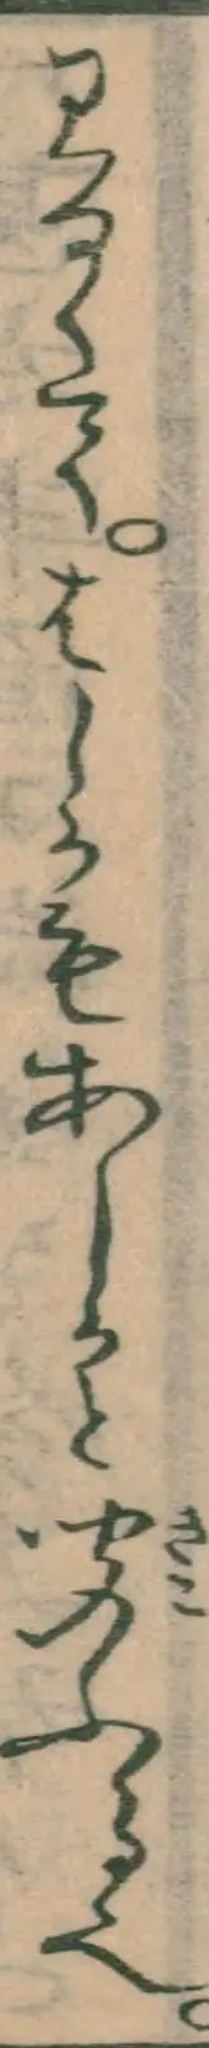わるくて。はしかもあしかと聞ふる也。
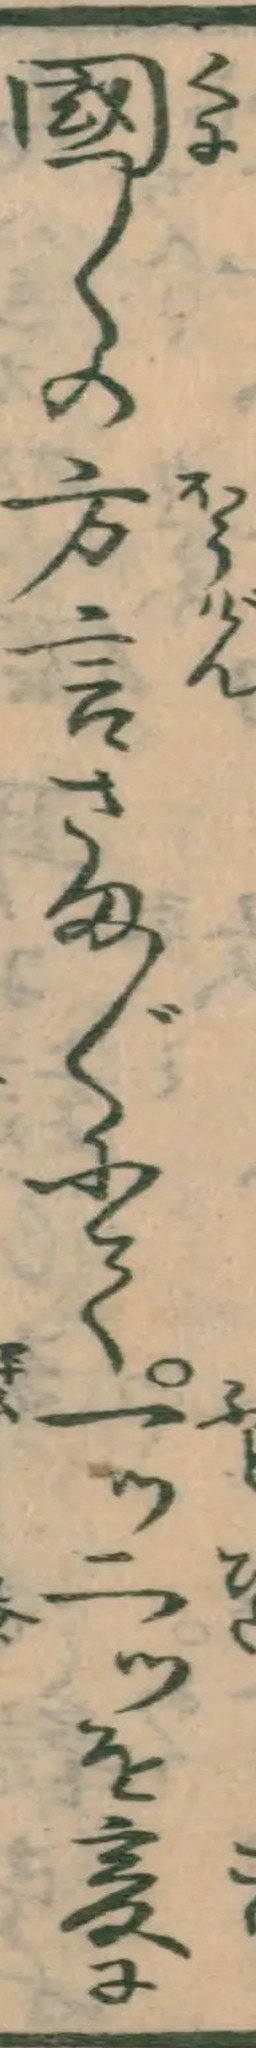国々の方言さま〴〵にて。一ツ二ツを爰に
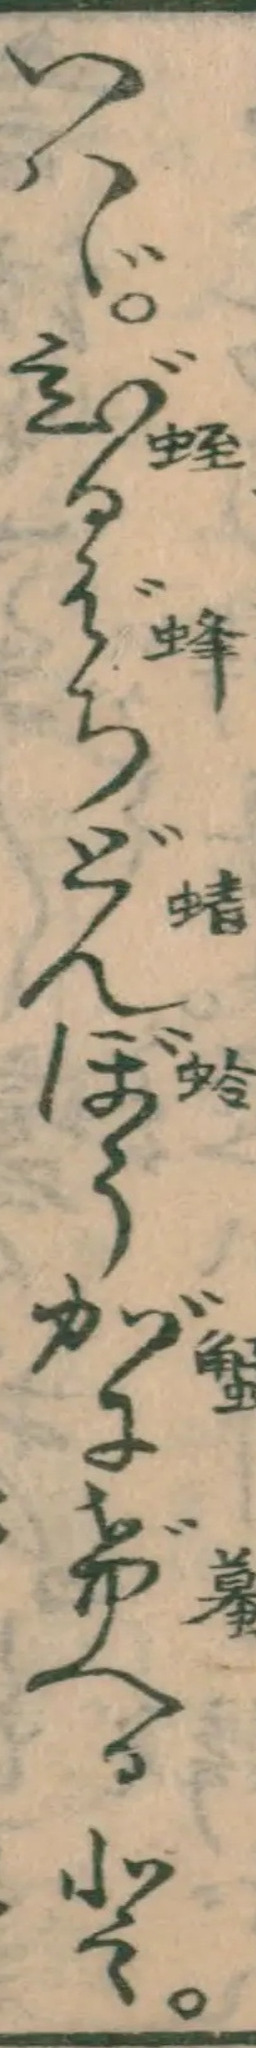いはゞ。びるばちどんぼうがにげへるとて。
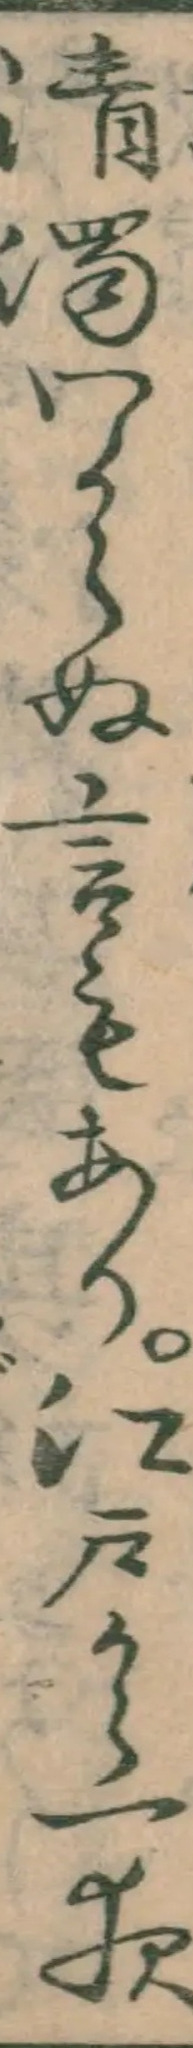清濁わからぬ言もあり。江戸から一夜
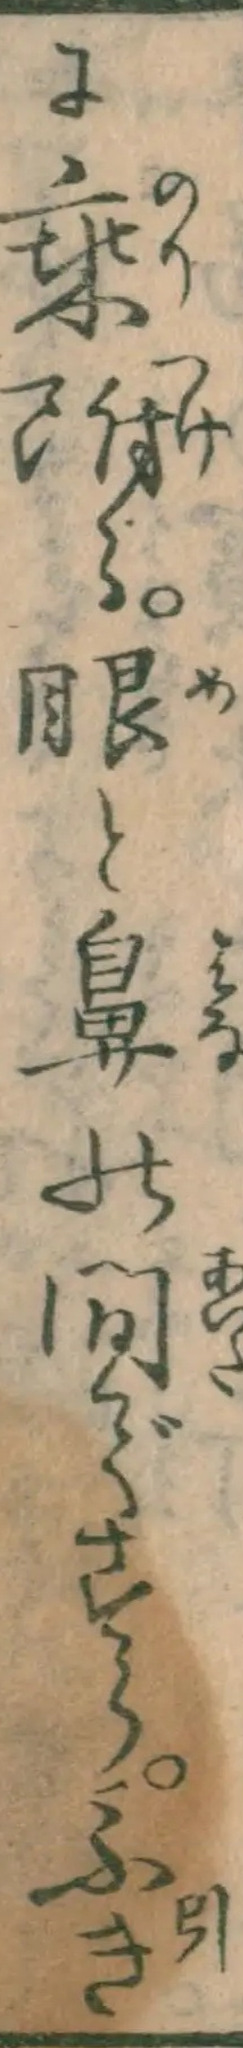に乗附る。眼と鼻の間ですら。ふき
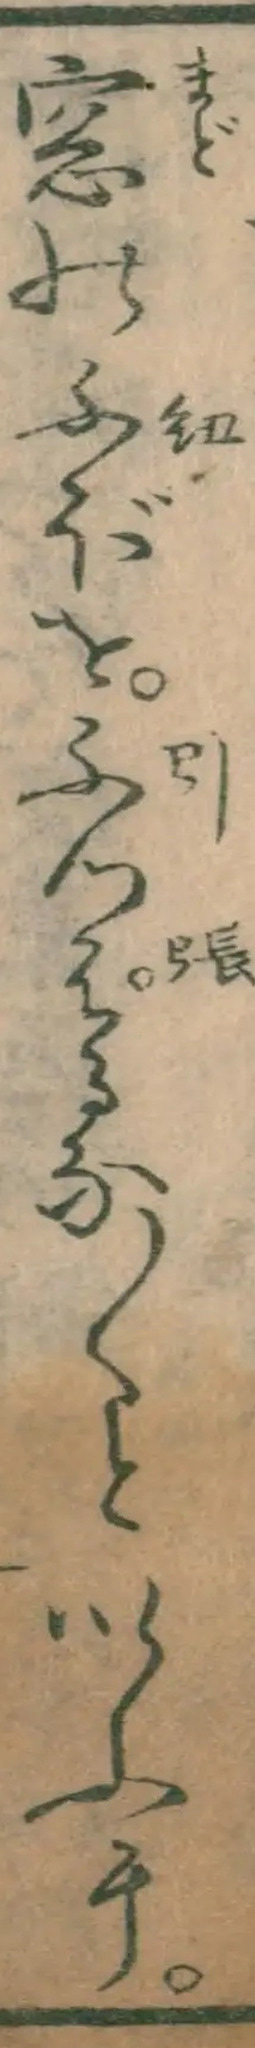窓のふぼを。ふつぱるな〳〵といふに。
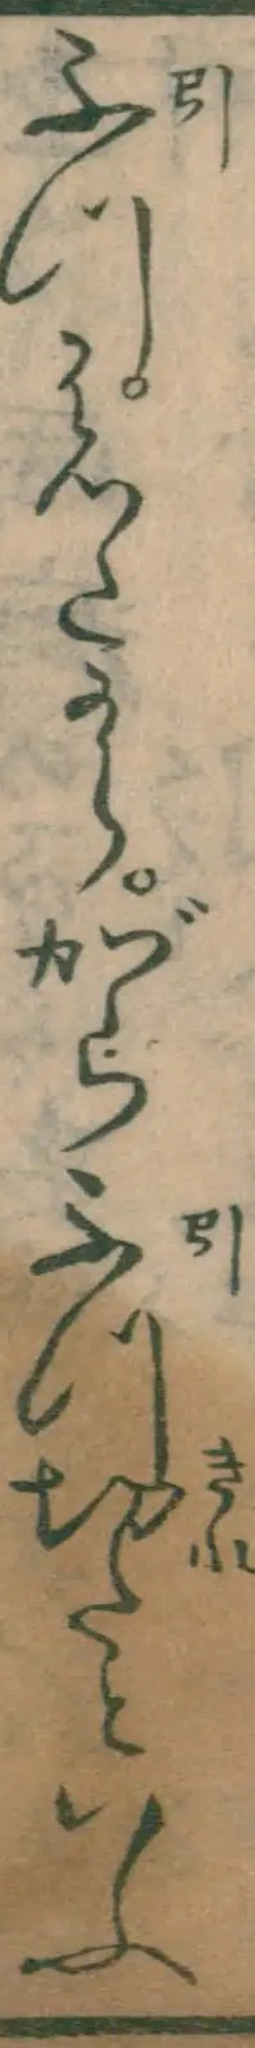ふつぱつたから。がらふつ切といふ。

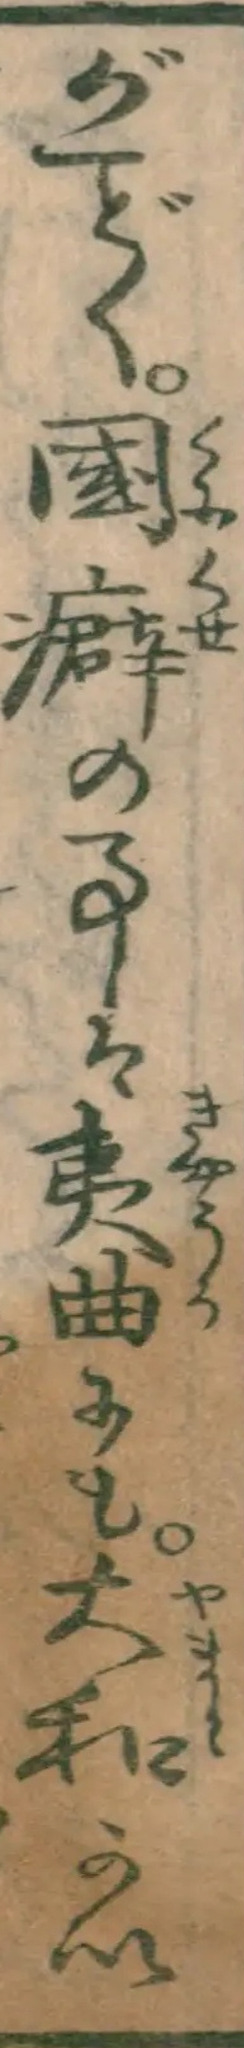がこどく。国癖の事は夷曲にも。大和かい
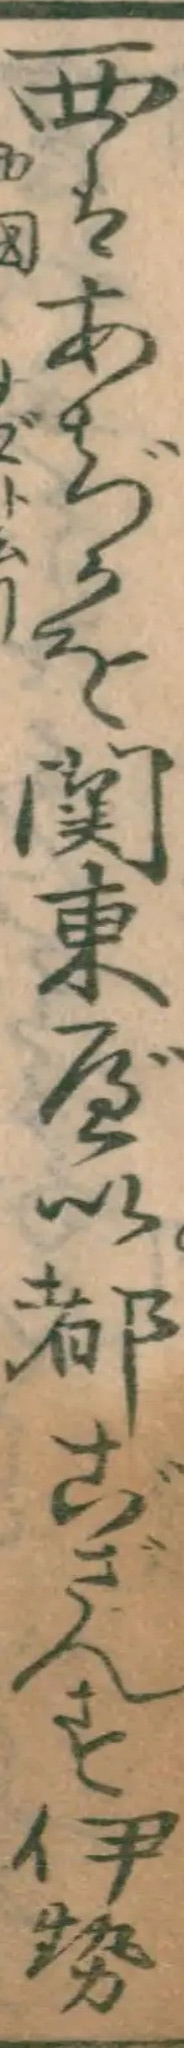西はあぢかを関東べい。都ござんす伊勢
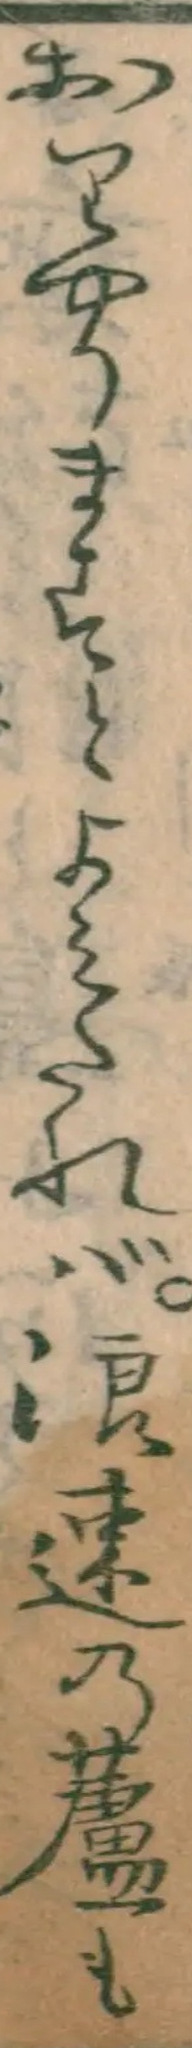おりやりますとよみたれば。浪速の蘆も
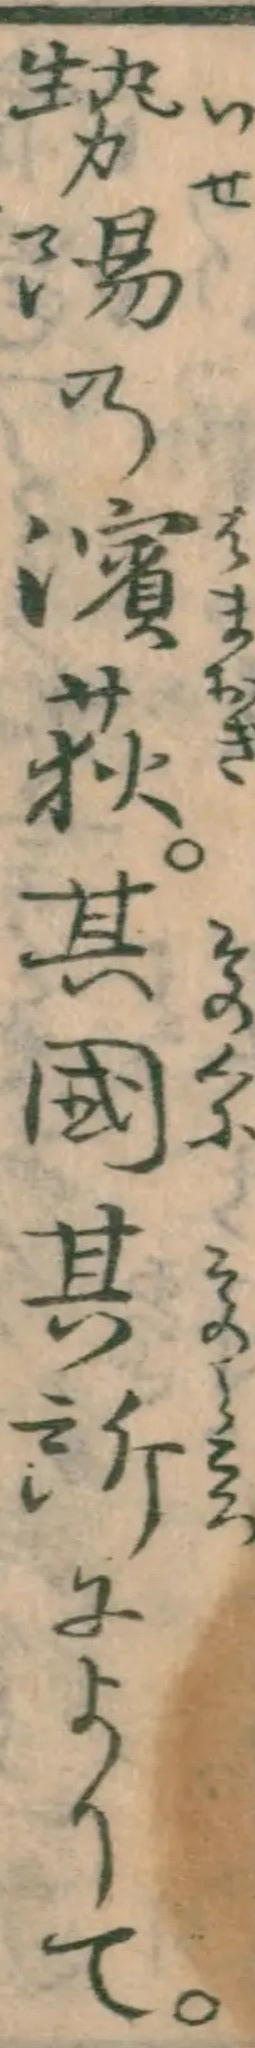勢陽の浜萩。其国其所によりて。
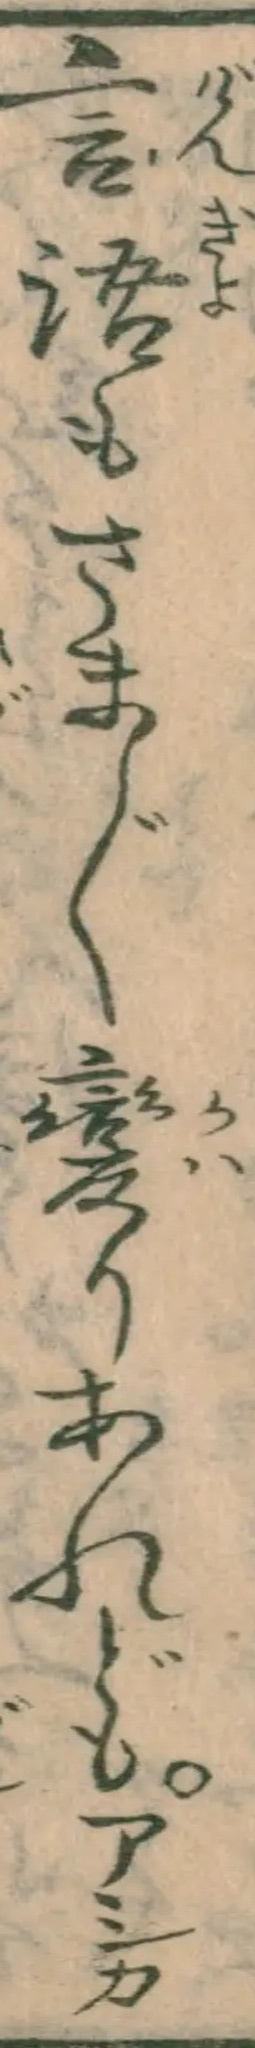言語もさま〴〵変りあれども。アシカ
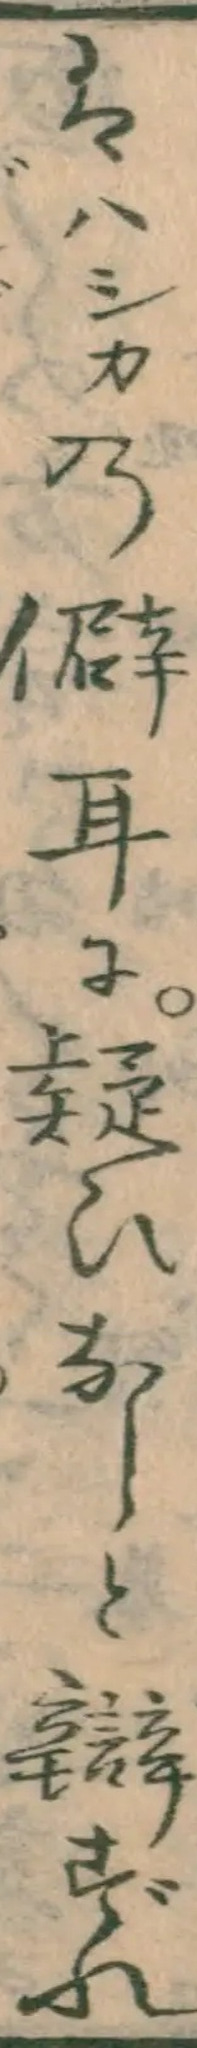はハシカの僻耳に。疑ひなしと弁ずれ
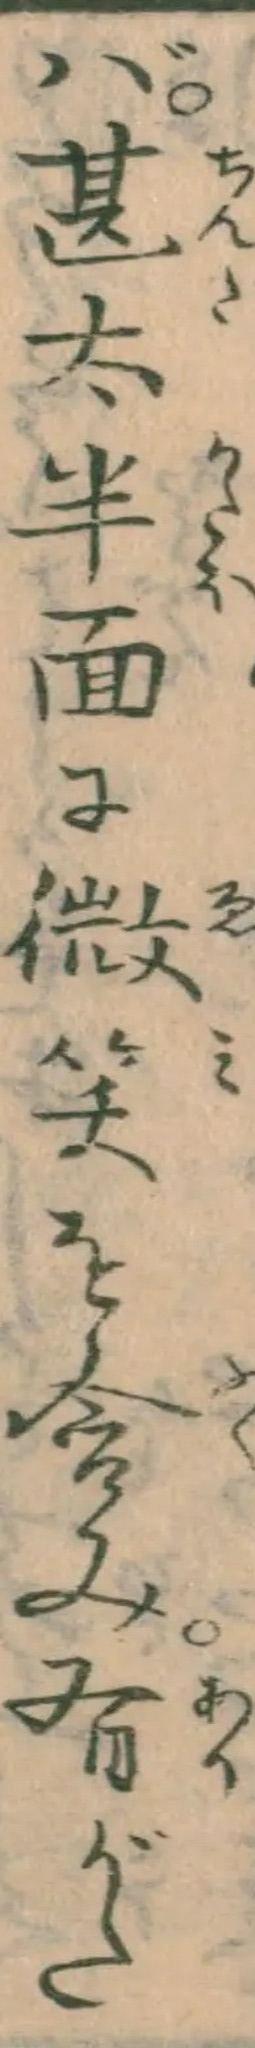ば。甚太反面に微笑を含み。有がた
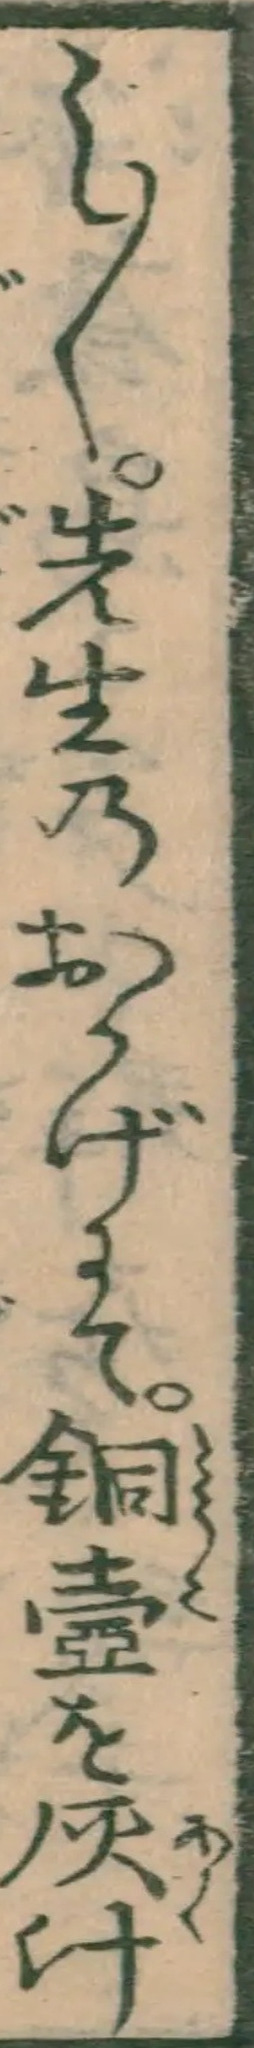し〳〵。先生のおかげにて。銅壺を灰汁
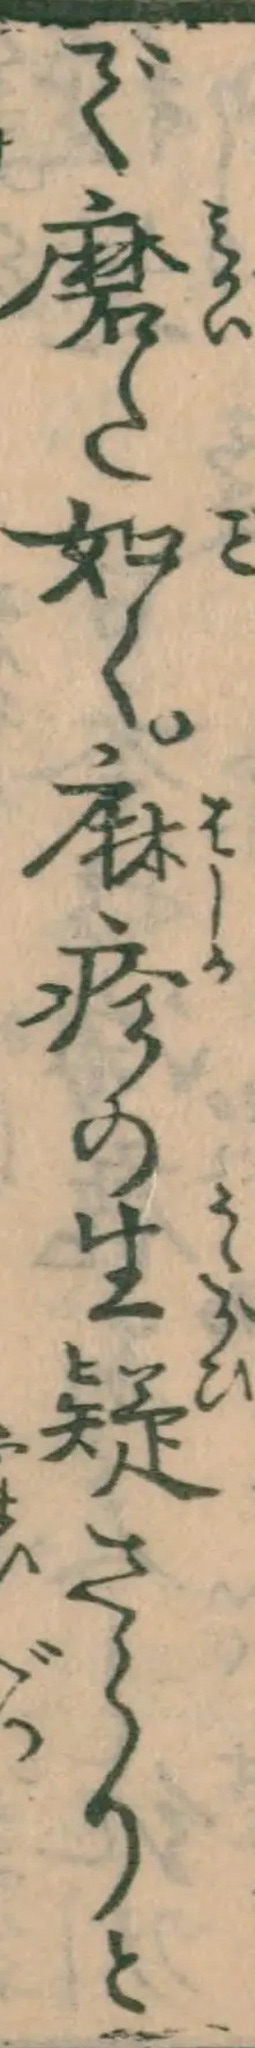で磨た如く。麻疹の生疑さらりと
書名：麻疹戯言
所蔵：国立国会図書館 National Diet Library, JAPAN
